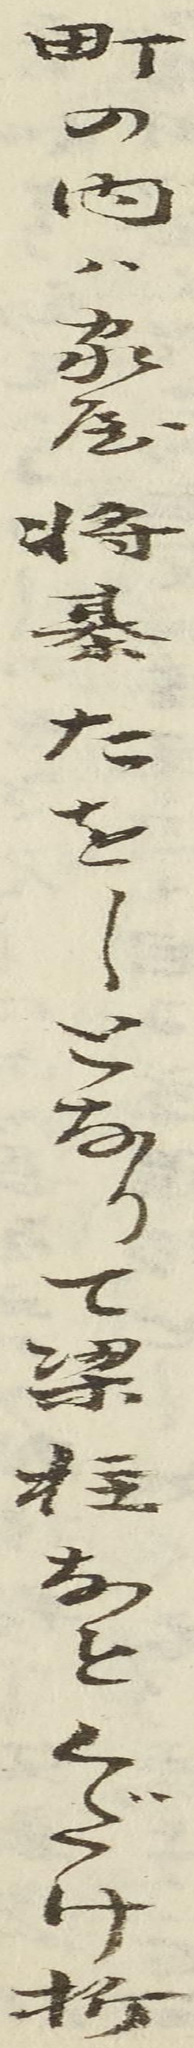町の内ハ家屋将基たをしとなりて梁柱なとくだけ折
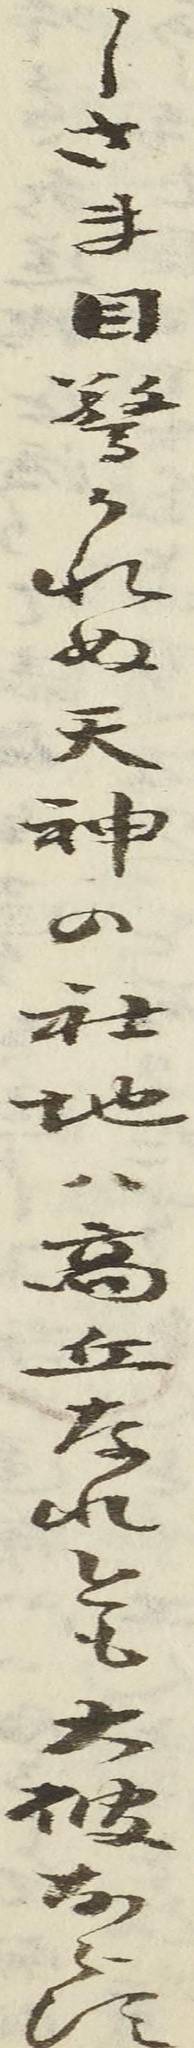しさま目驚かれぬ天神の社地ハ高岳なれとも大破ならす
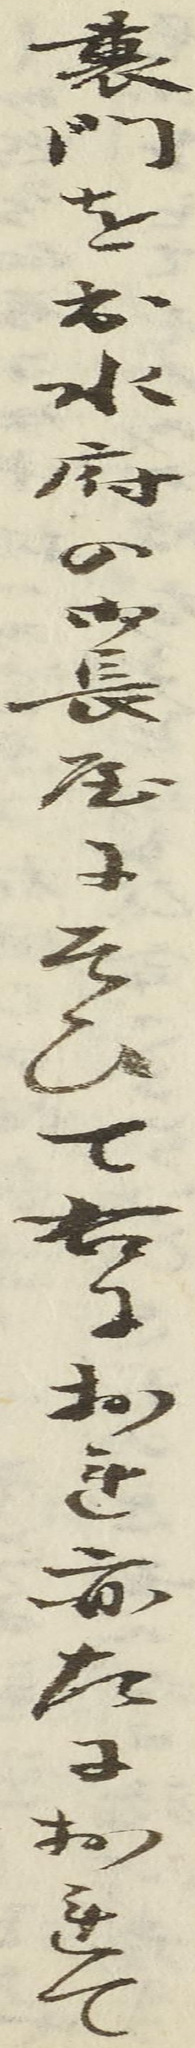裏門を出水府の御長屋にそひて右におれ亦左におれて
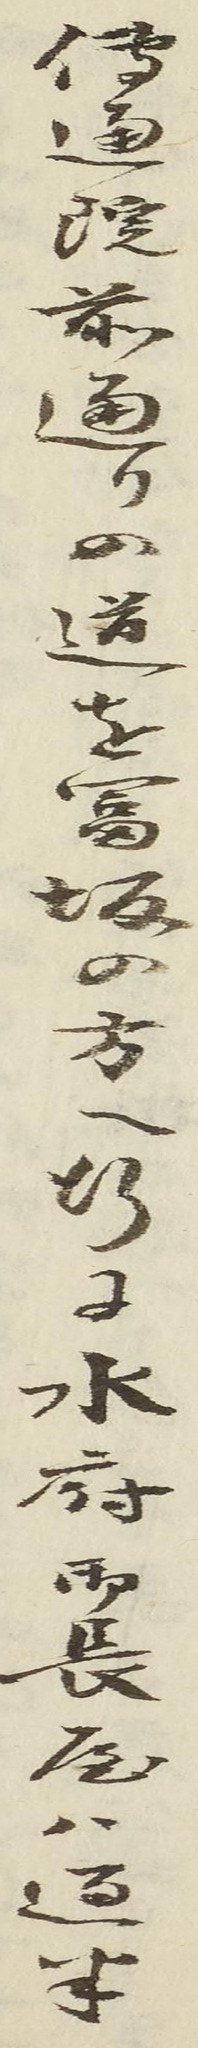伝通院前通りの道を富坂の方へ行に水府御長屋ハ過半
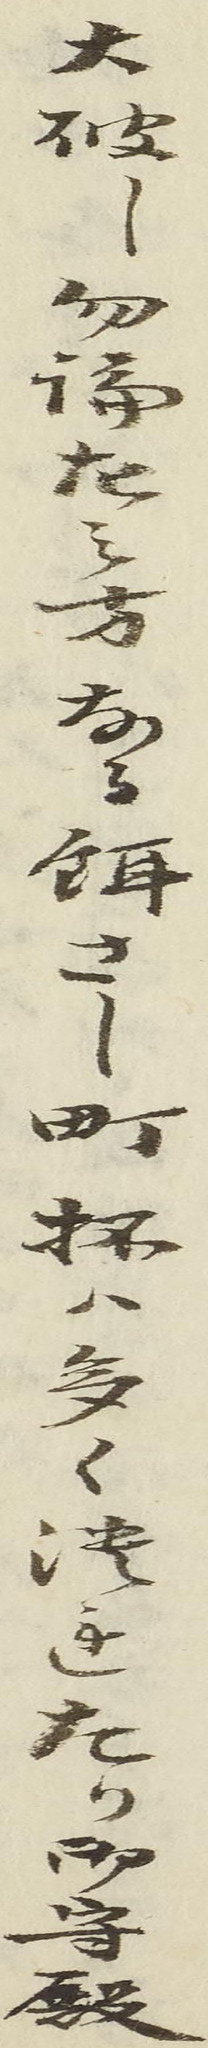大破し勿論左の方なる餌さし町抔ハ多く潰れたり御守殿
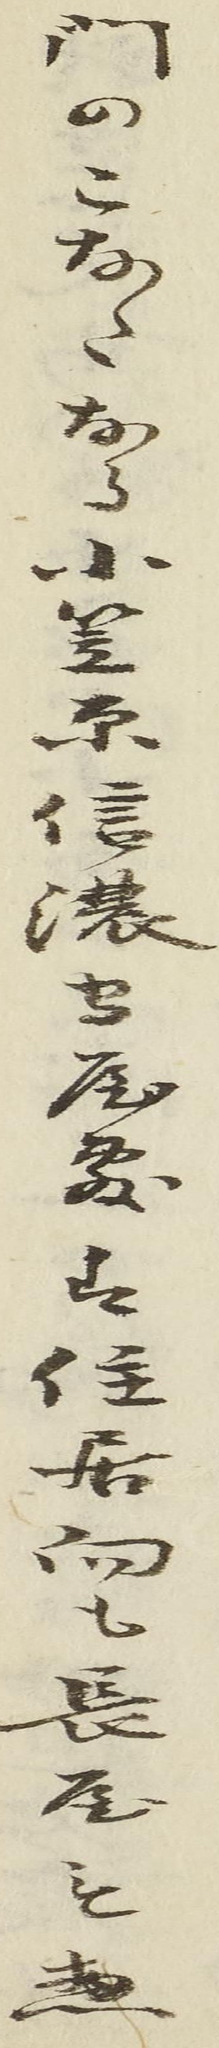門のこなた小笠原信濃守屋敷は住居向も長屋も惣

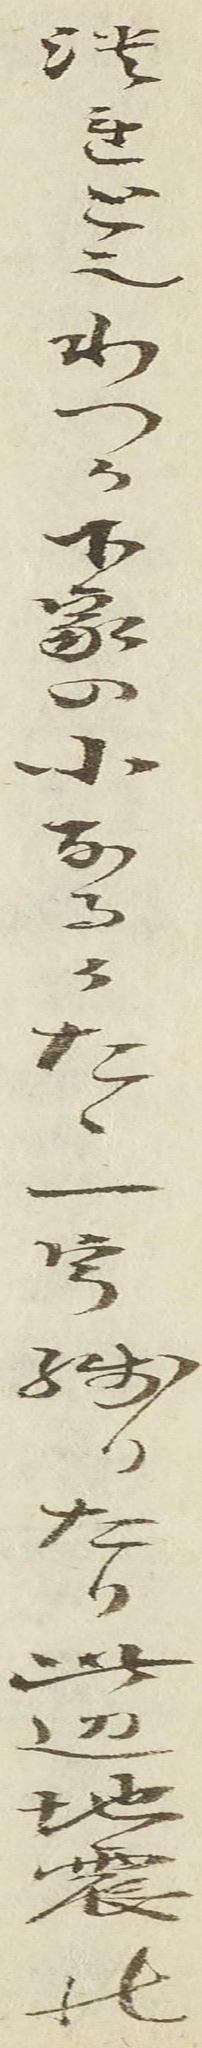潰れと也わつか下家の小なるかたゝ一宇残りたり此辺地震の
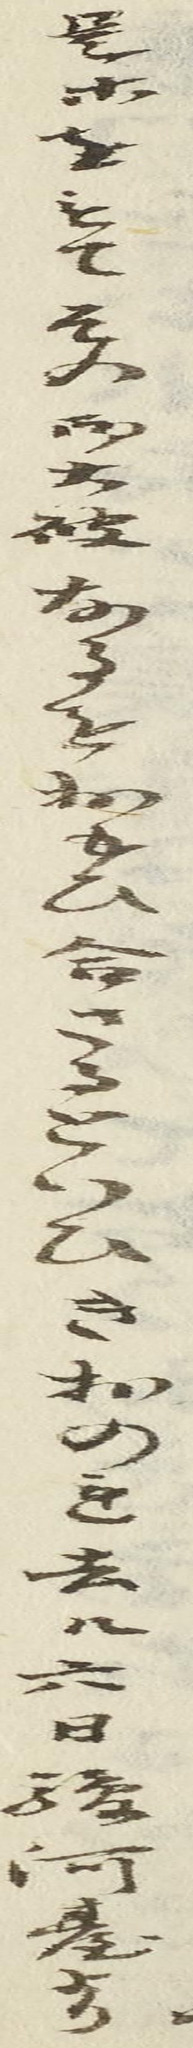是らをもてその御大破なるをおもひ合さるといひきおのれ去ㇽ六日駿河台より
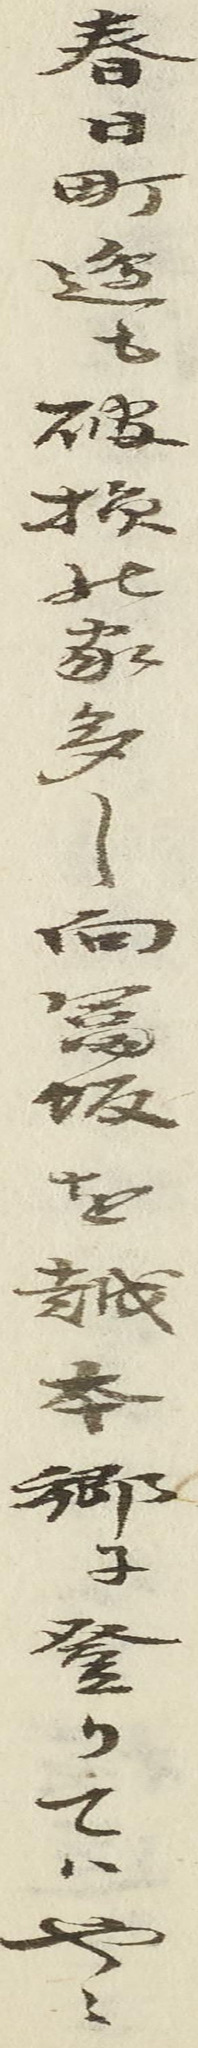春日町辺も破損の家多し向富坂を越本郷に登りてハやゝ
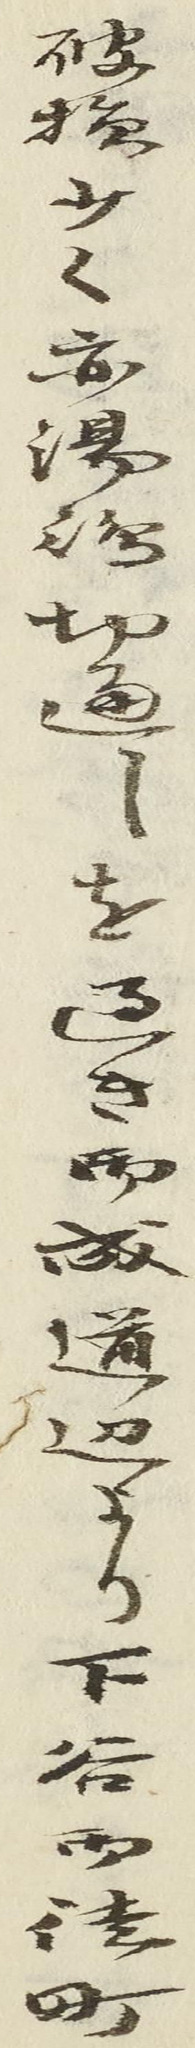破損少く亦湯嶋切通を過き御成道辺より下谷御徒町
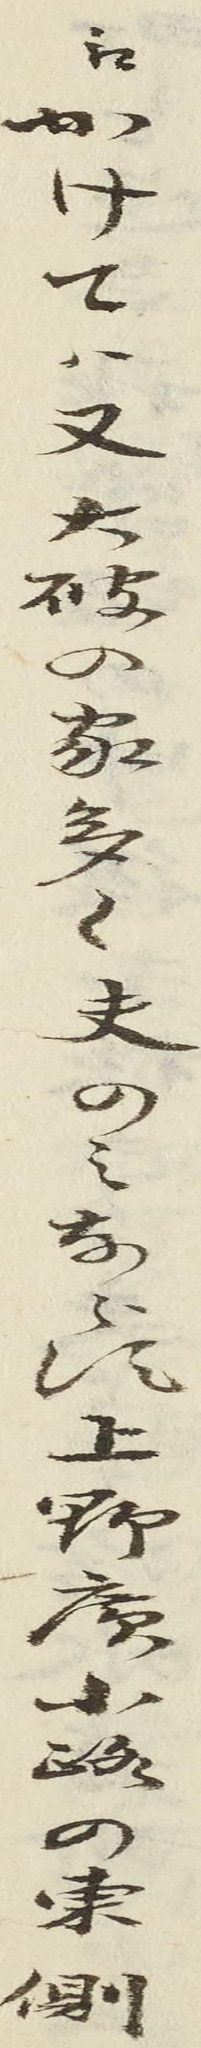江かけてハ又大破の家多く夫のミならす上野広小路の東側
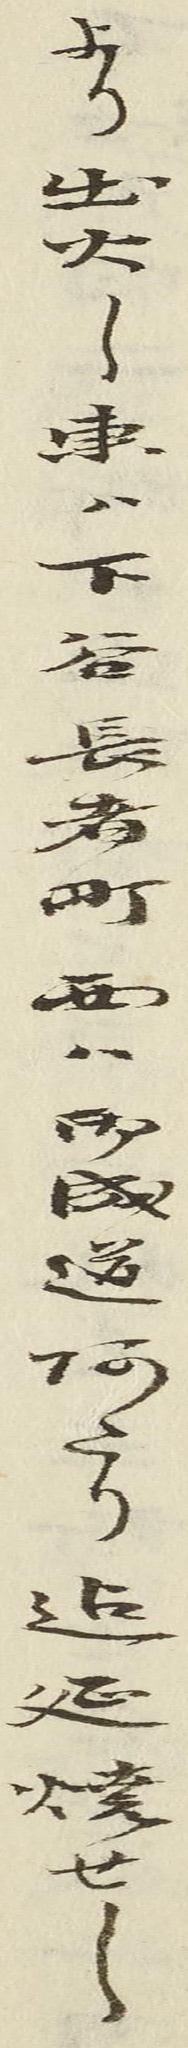より出火し東ハ下谷長者町西ハ御成道あたり迄延焼せし
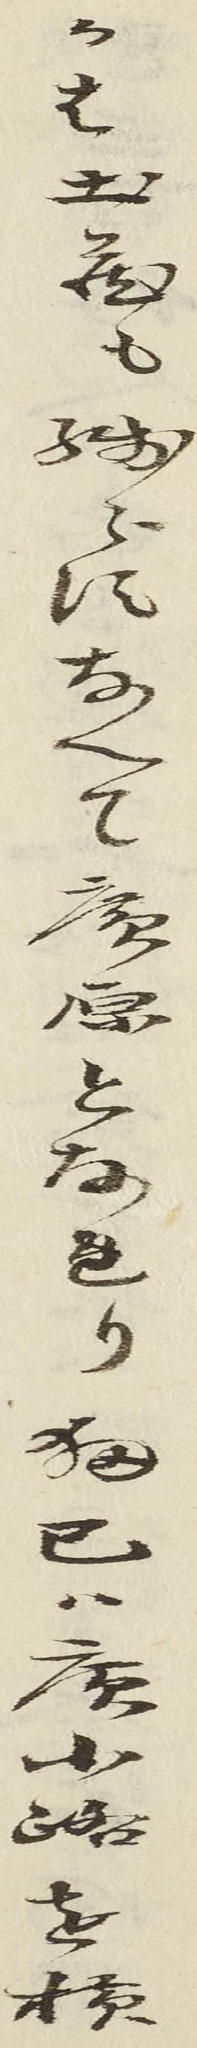かは土蔵も残らすなへて廣原となれり扨己は広小路を横
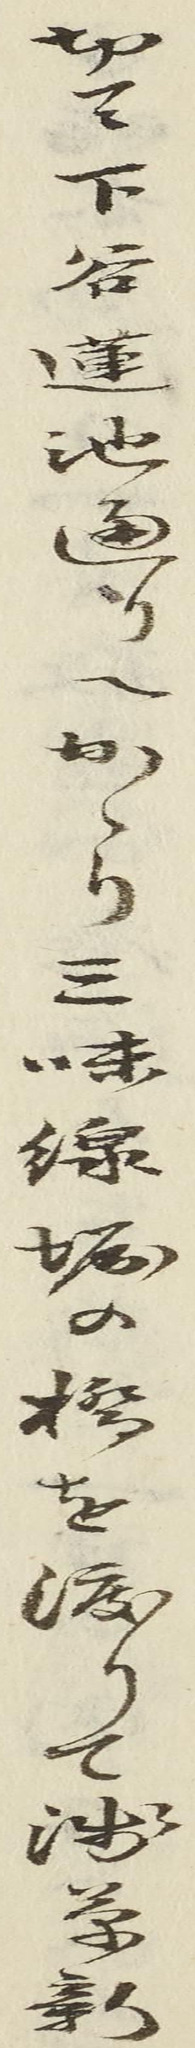切て下谷蓮池通りへかゝり三味線堀の橋を渡りて浅草新
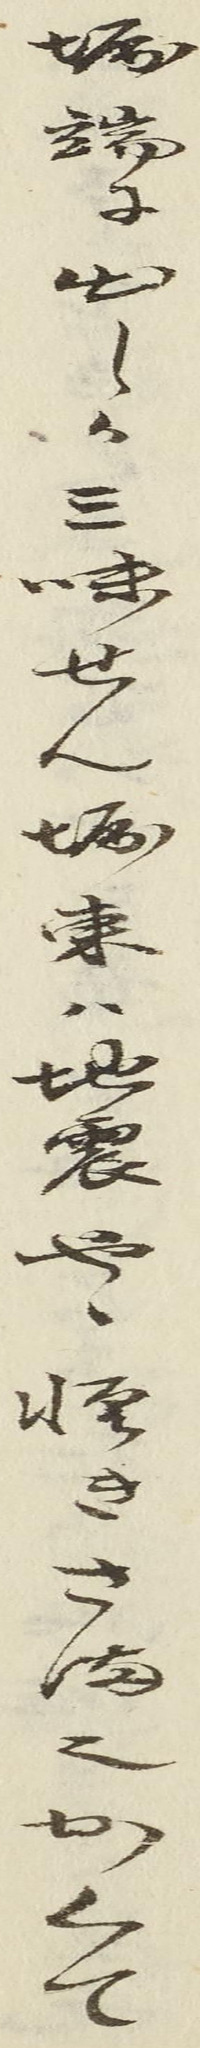堀端に出しか三味せん堀東ハ地震やゝ軽きさま也かくて
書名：那為の後見艸　全
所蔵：東京大学地震研究所図書室 Earthquake Research Institute Library, The University of Tokyo, JAPAN
